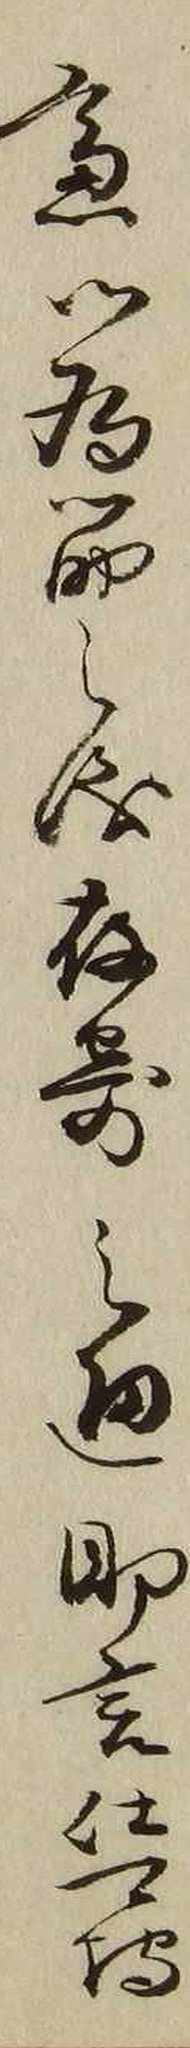慮御為筋之儀存寄之通助言仕可埒
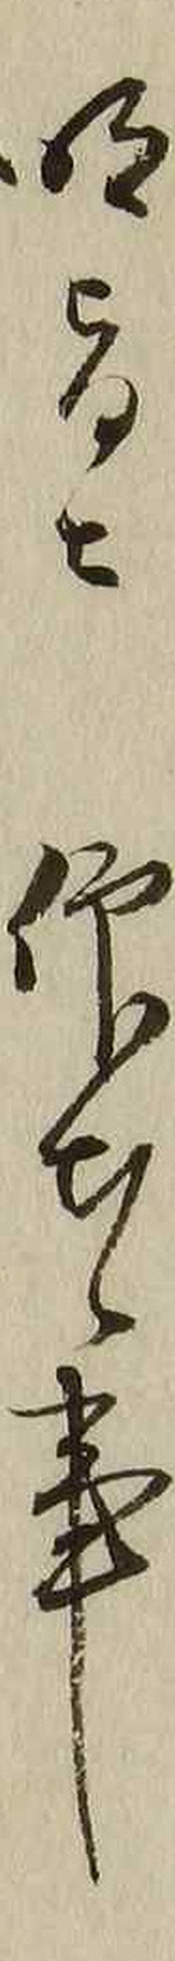明旨被仰出候事
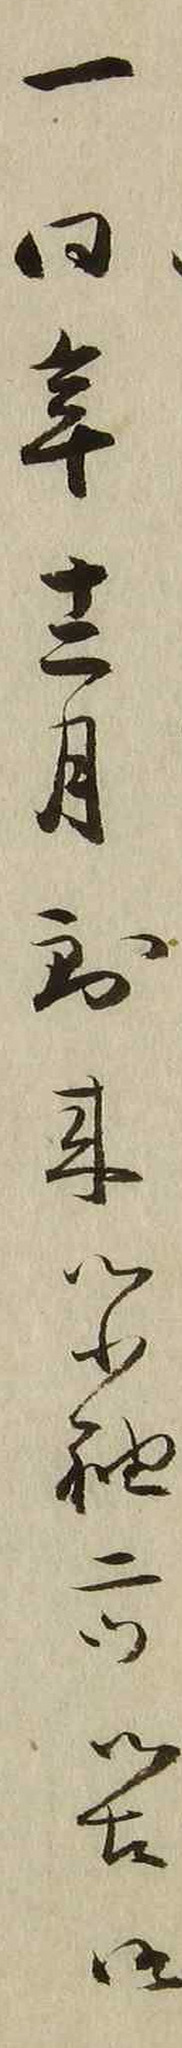一同年十二月到来御子袖二つ御古御
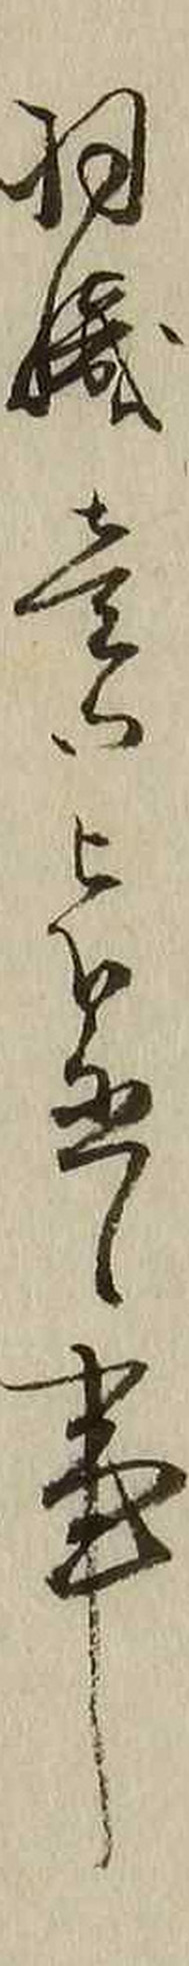羽織壱つ被下置候事
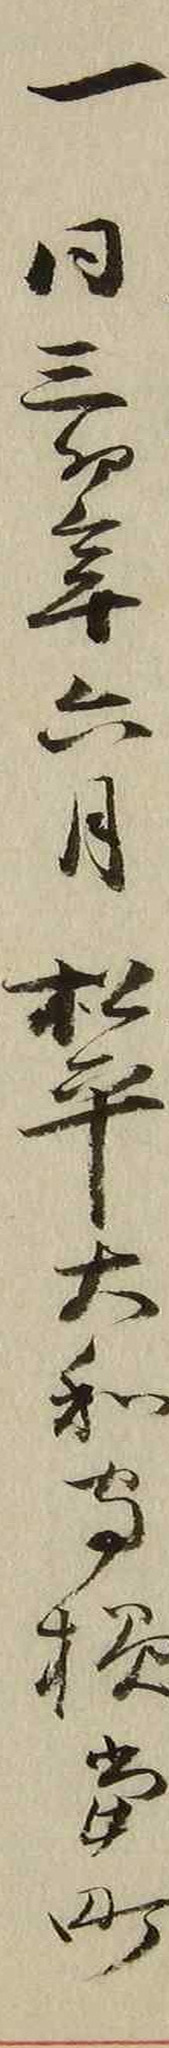一同三卯年六月松平大和守様当町
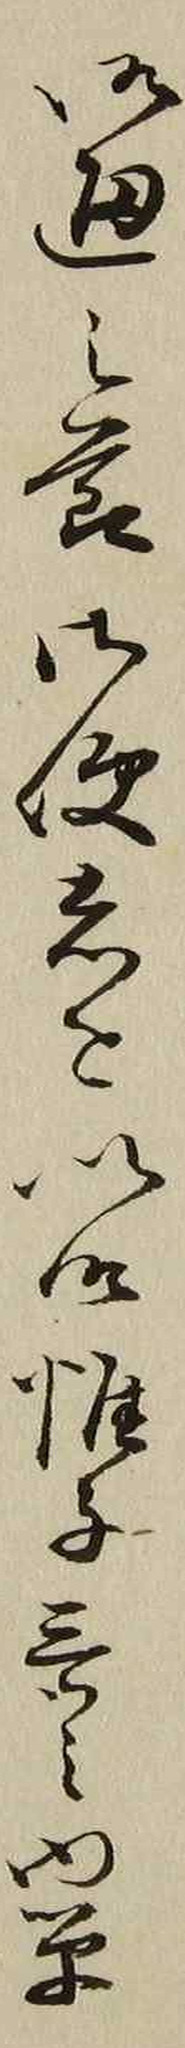御通之節御使者を以御帷子三つ之内単
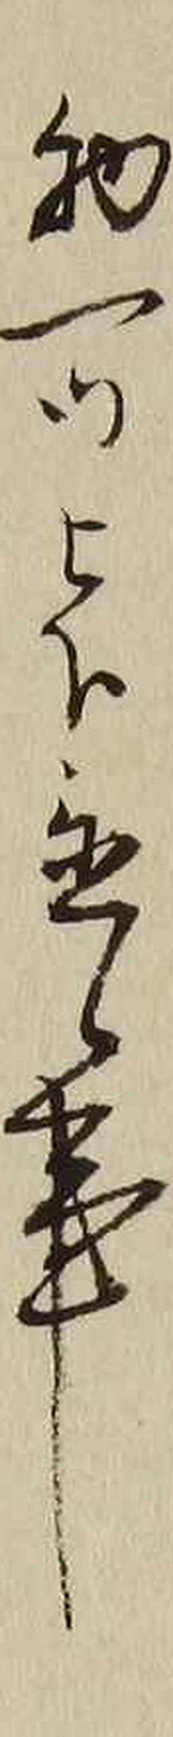物一つ被下置候事
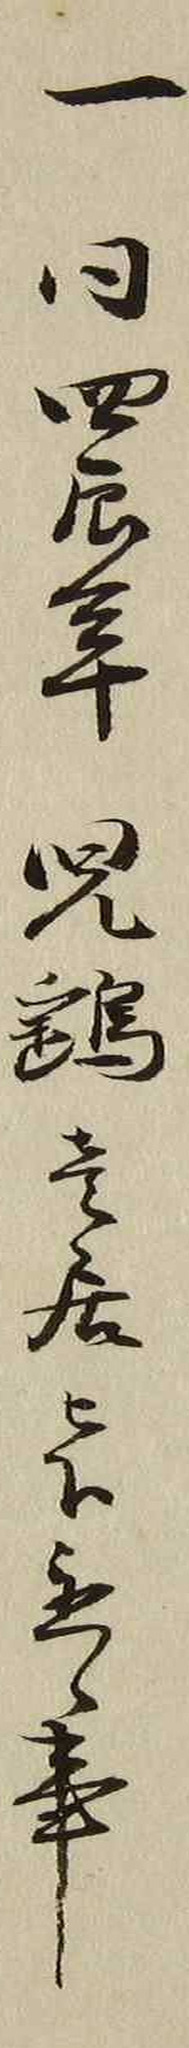一同四辰年児鶴壱居被下置候事
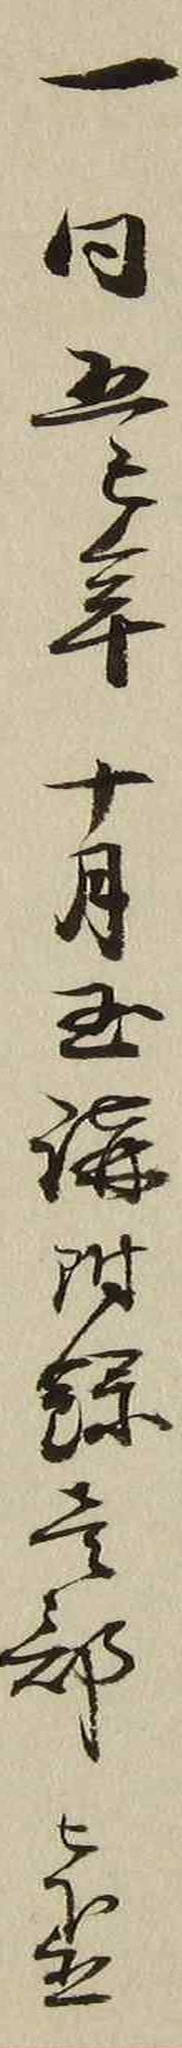一同五巳年十月玉講附録壱部被下置
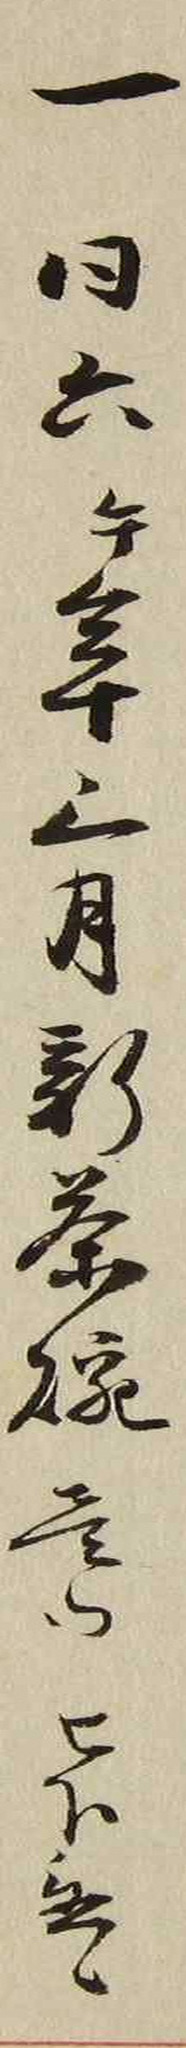一同六午年三月新茶碗壱つ被下置候
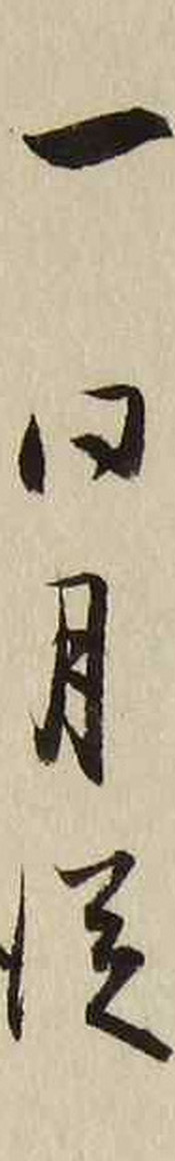一同月従
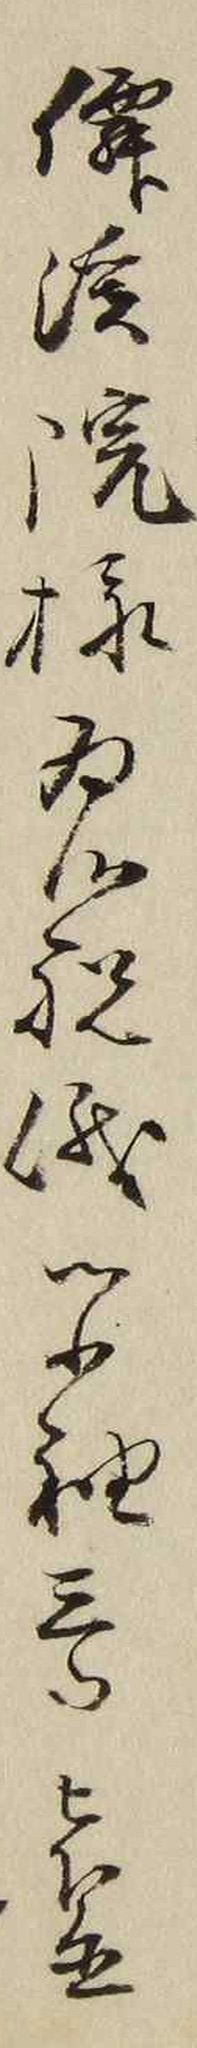僲渓院様為御祝儀御小袖三つ被下置
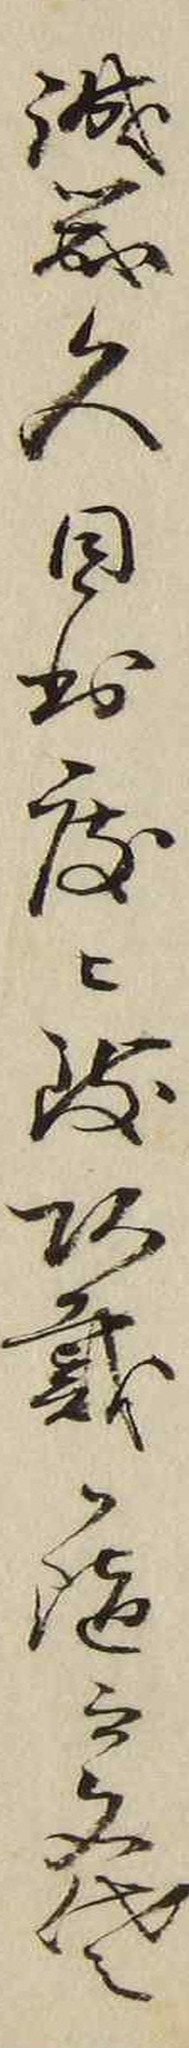誠幾久目出度被致頂戴候随而名代之

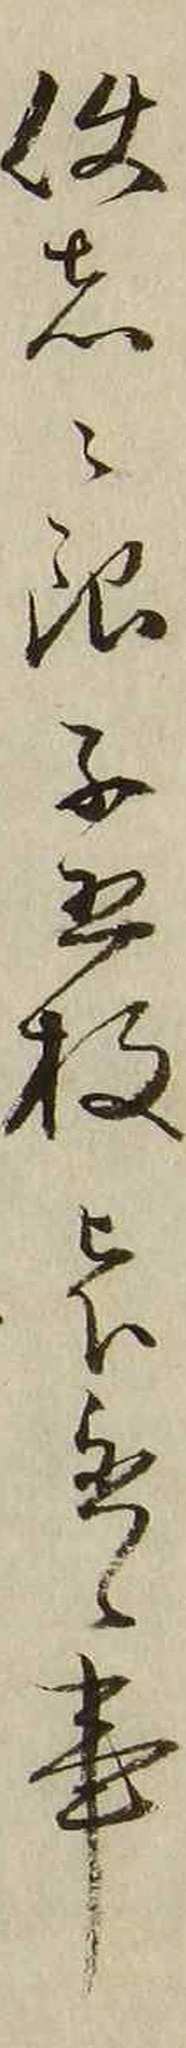使者に銀子五枚被下置候事
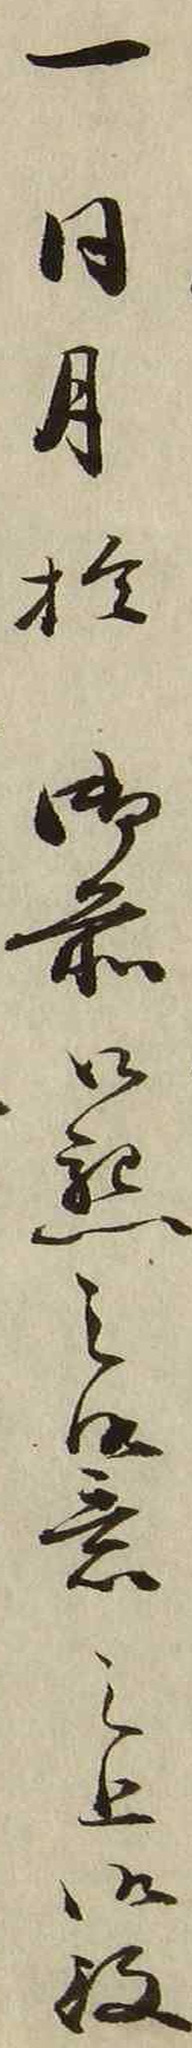一同月於御前御懇之御意之上御役
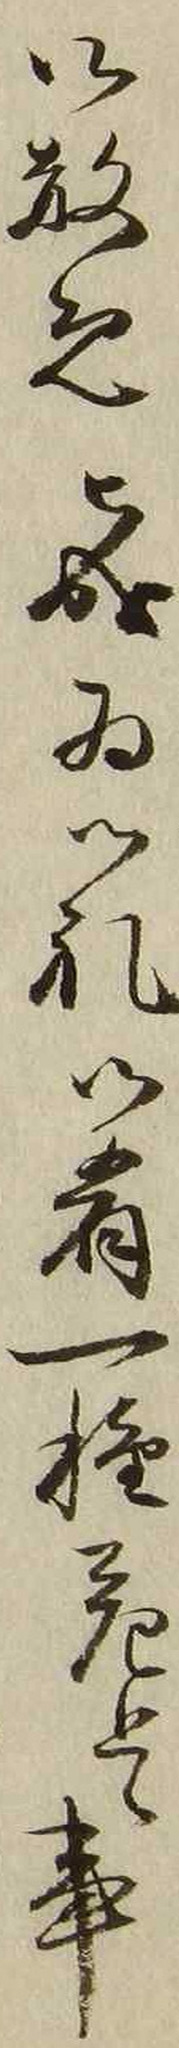御赦免被成為御礼御肴一種差上候事
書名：諸士系譜　巻之292　き之部1
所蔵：会津若松市立会津図書館
